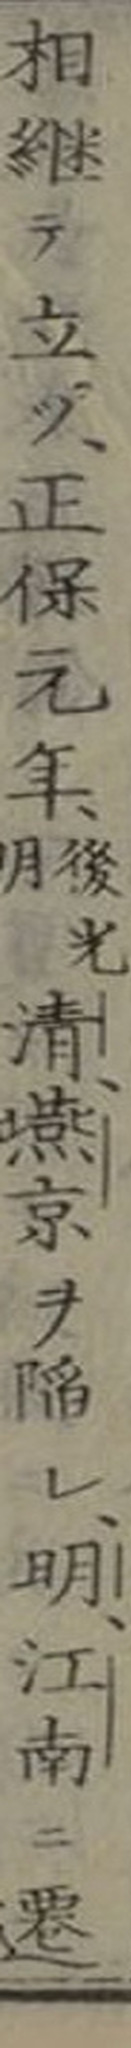相継テ立ツ、正保元年、後光明清、燕京ヲ陥レ、明、江南ニ遷
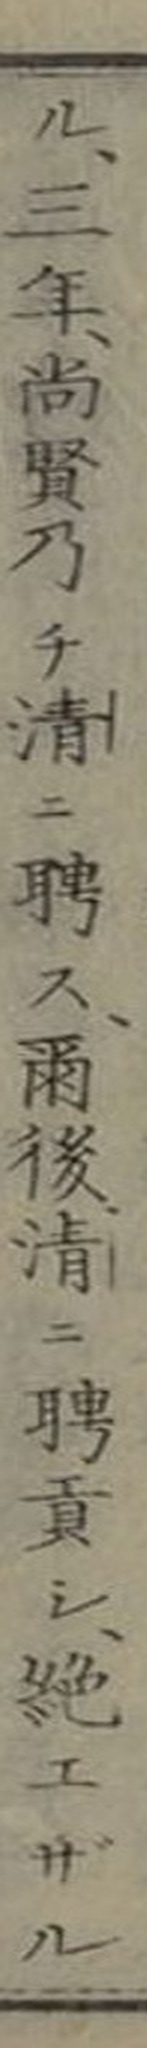ル、三年、尚賢乃チ清ニ聘ス、爾後、清ニ聘貢シ、絶エザル
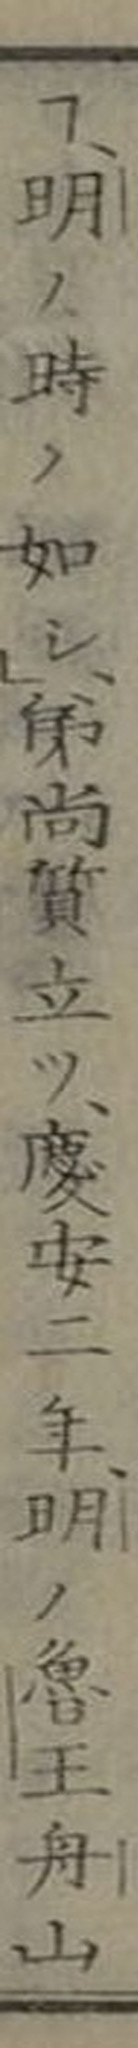ヿ、明ノ時ノ如シ、」弟尚質立ツ、慶安二年、明ノ魯王舟山
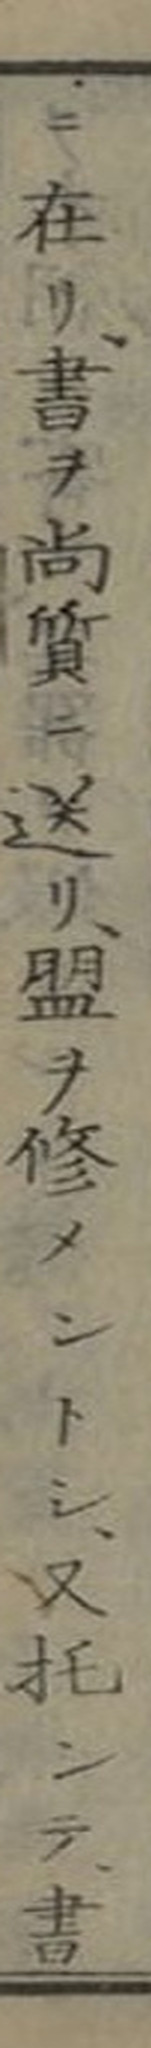ニ在リ、書ヲ尚質ニ送リ、盟ヲ修メントシ、又托ンテ、書

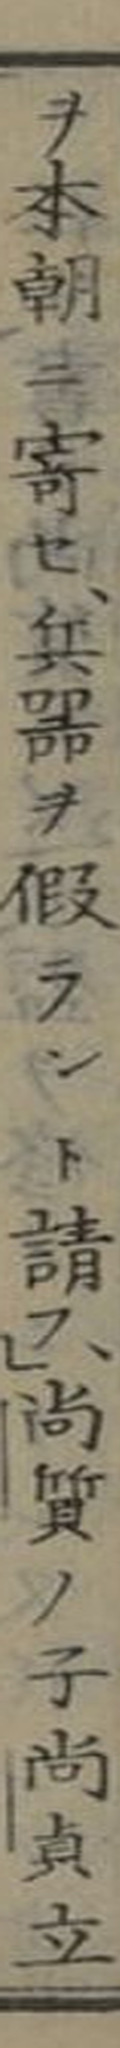ヲ本朝ニ寄セ、兵器ヲ仮ラント請フ、」尚質ノ子尚貞立
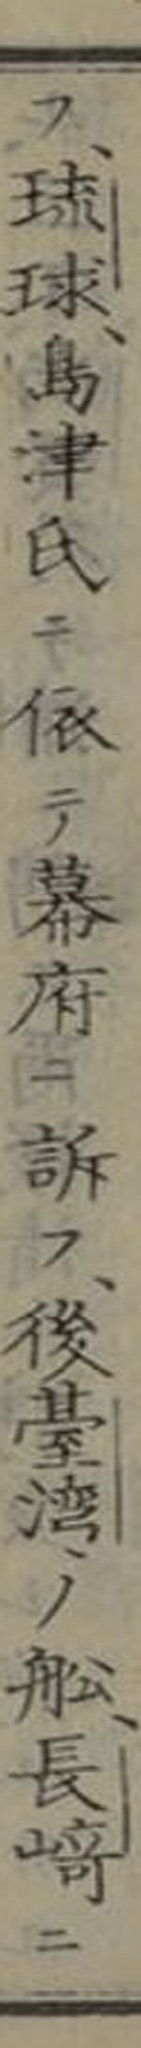フ、琉球、島津氏ニ依テ幕府ニ訴フ、後台湾ノ船、長崎ニ
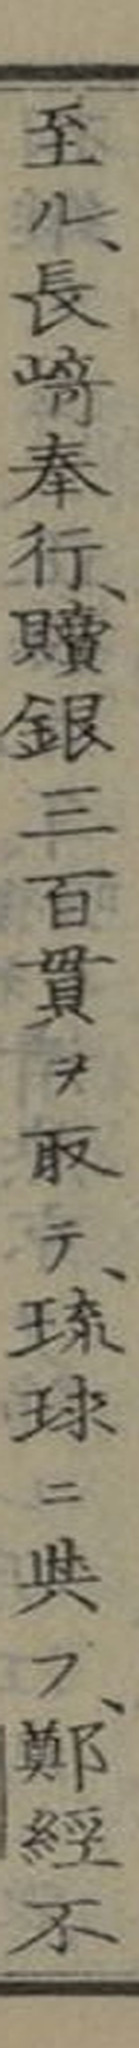至ル、長崎奉行、贖銀三百貫ヲ取テ、琉球ニ与フ、鄭経不
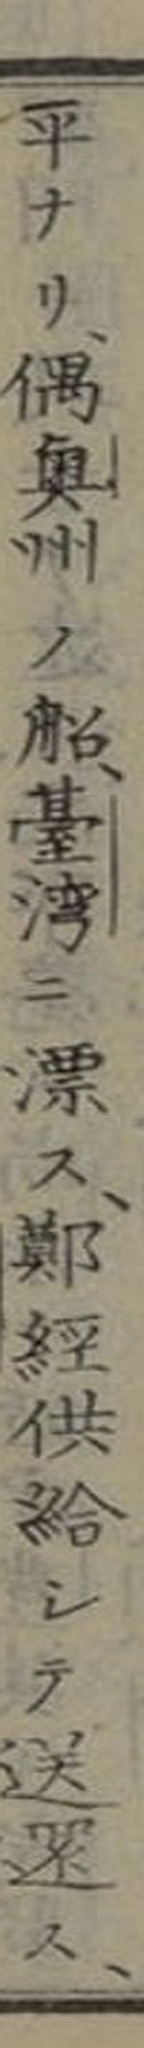平ナリ、偶奥州ノ船、台湾ニ漂ス、鄭経供給シテ送還ス、
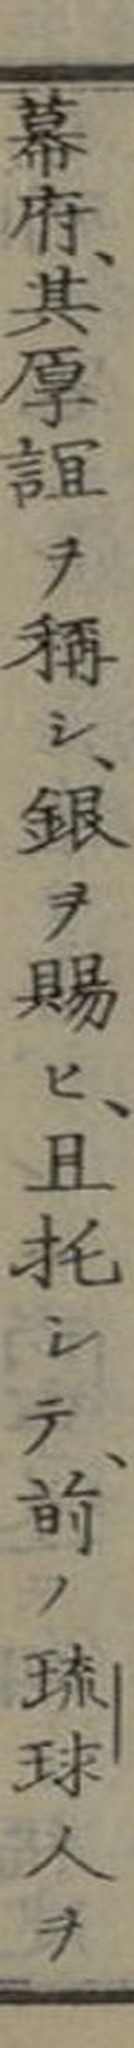幕府、其厚誼ヲ称シ、銀ヲ賜ヒ、且托シテ、前ノ琉球人ヲ
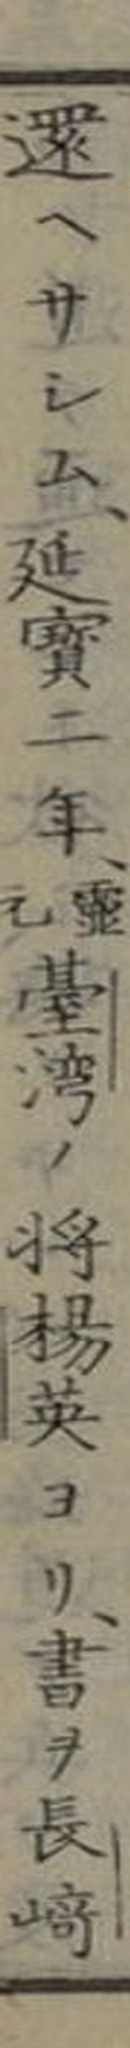還ヘサシム、延宝二年、霊元台湾ノ将楊英ヨリ、書ヲ長崎
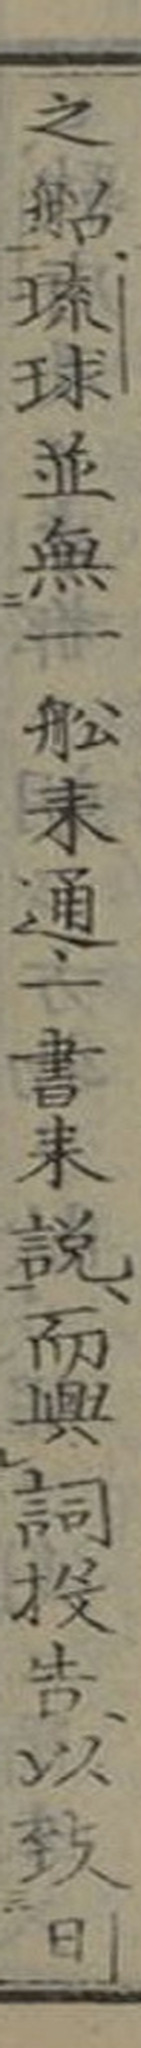之船琉球並無一船来通一書来説、而興詞投告、以致日
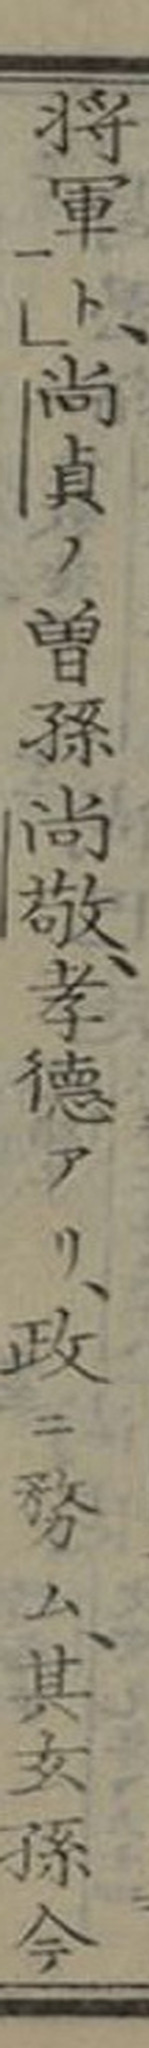将軍ト、」尚貞ノ曾孫尚敬、孝徳アリ、政ニ務ム、其玄孫今
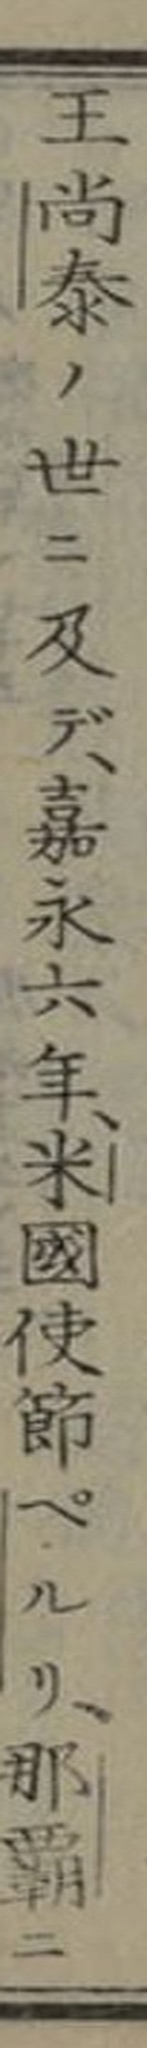王尚泰ノ世ニ及デ、嘉永六年、米国使節ペルリ、那覇ニ
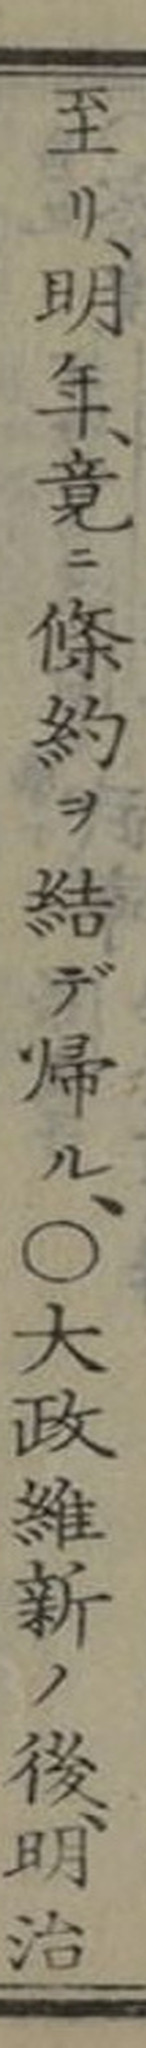至リ、明年、竟ニ条約ヲ結デ帰ル、○大政維新ノ後、明治
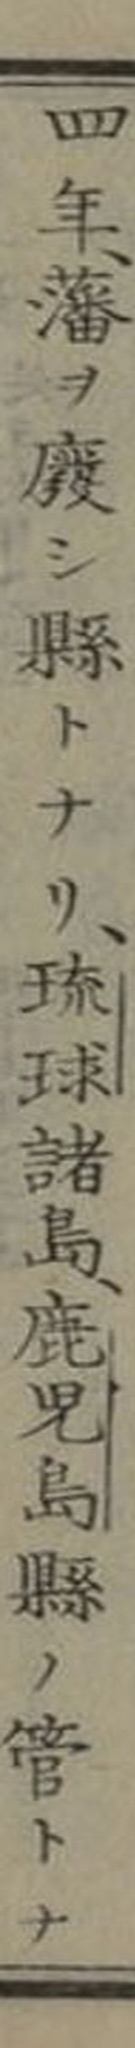四年、藩ヲ廃シ県トナリ、琉球諸島、鹿児島県ノ管トナ
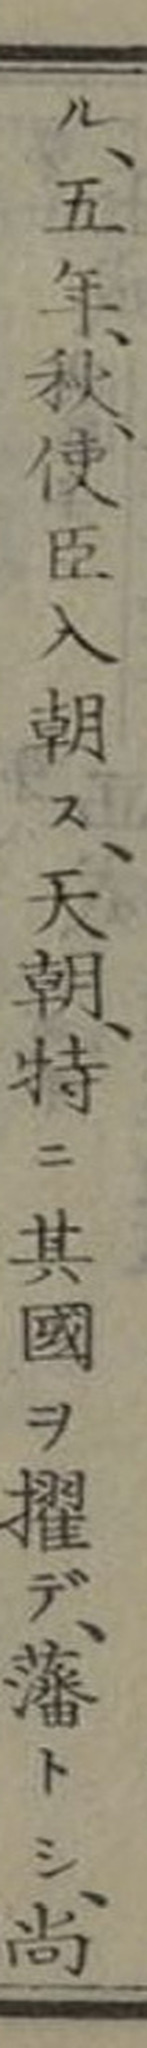ル、五年、秋、使臣入朝ス、天朝、特ニ其国ヲ擢デ、藩トシ、尚
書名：琉球新誌 図附 上
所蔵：University of the Ryukyus Library
